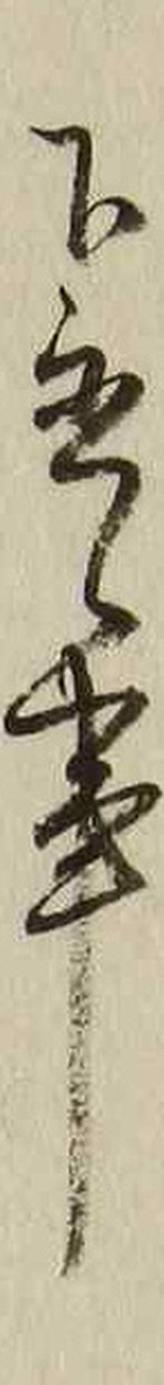下置候事
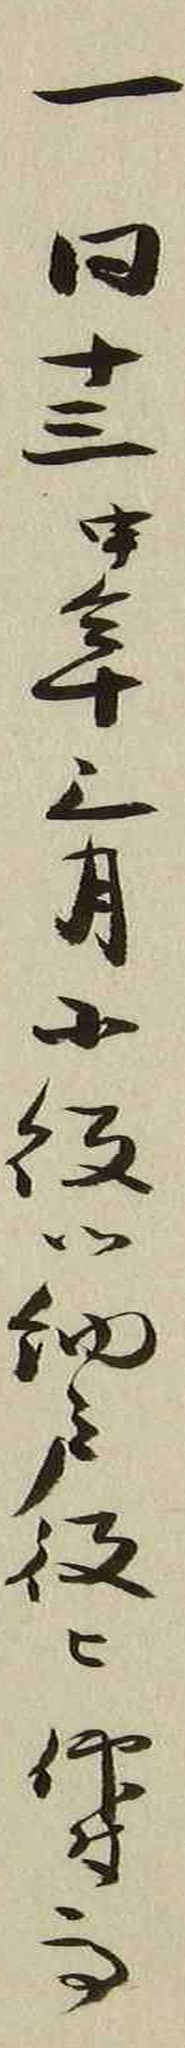一同十三申年三月小役御納戸役被仰付候事
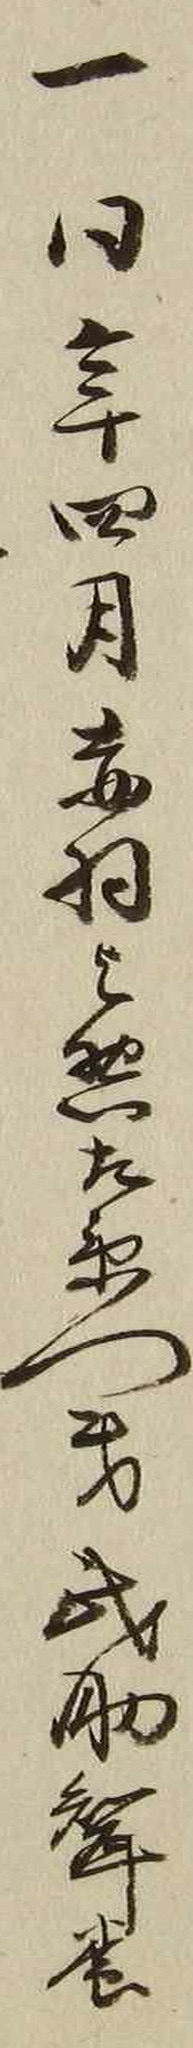一同年四月赤羽与惣左衛門弟武助聟養
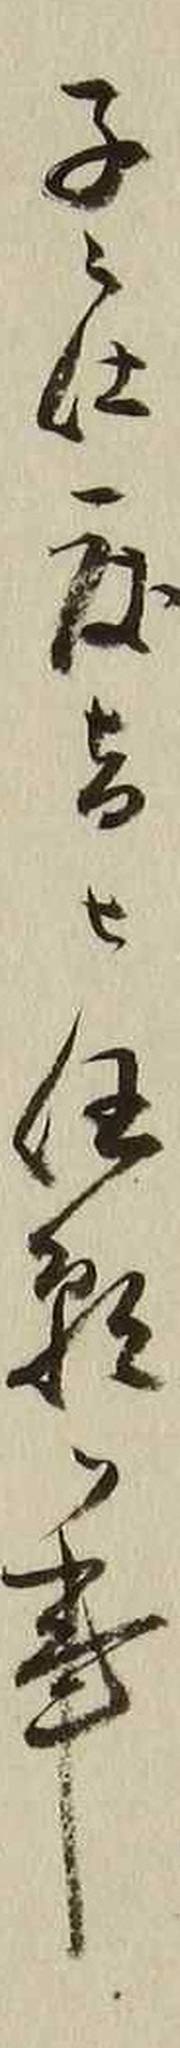子ニ仕度旨被任願候事
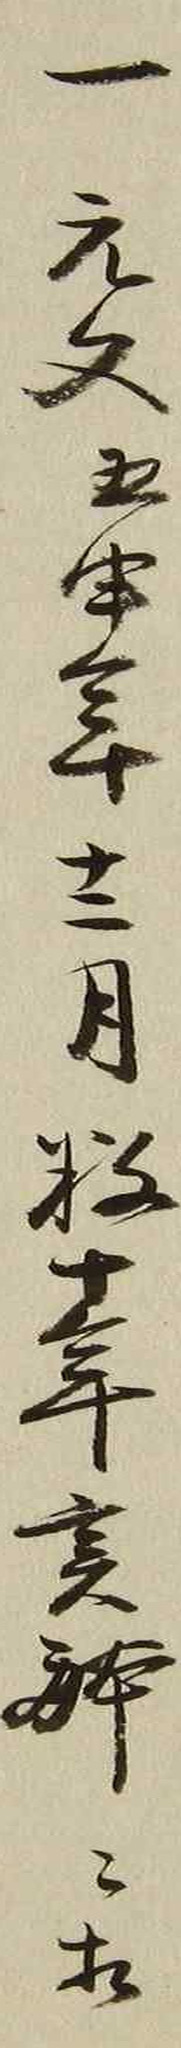一元文五申年十二月数十年実体ニ相
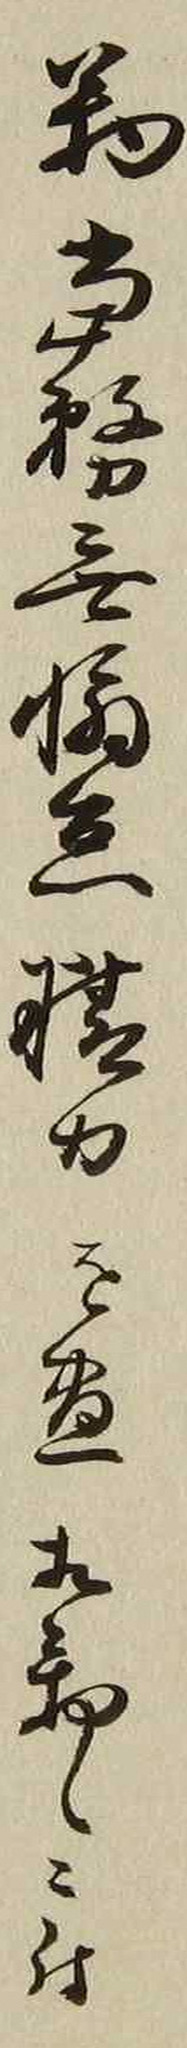勤当務無懈怠精力を尽相勤候ニ付
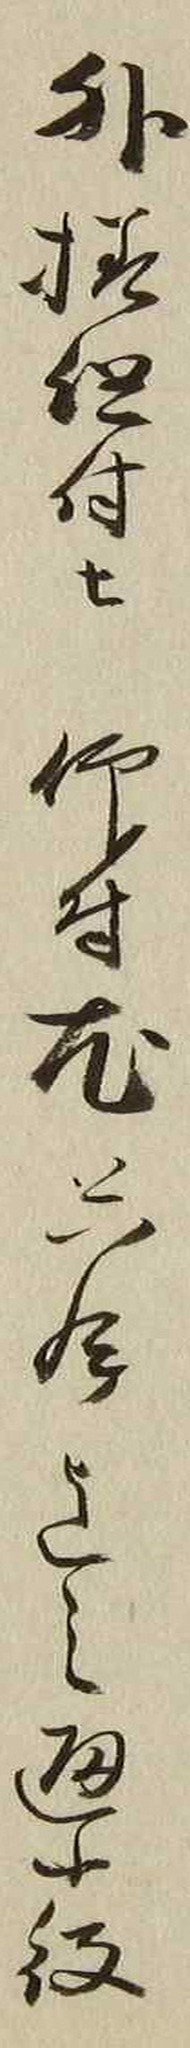外様組付被仰付尤只今迄之通小役
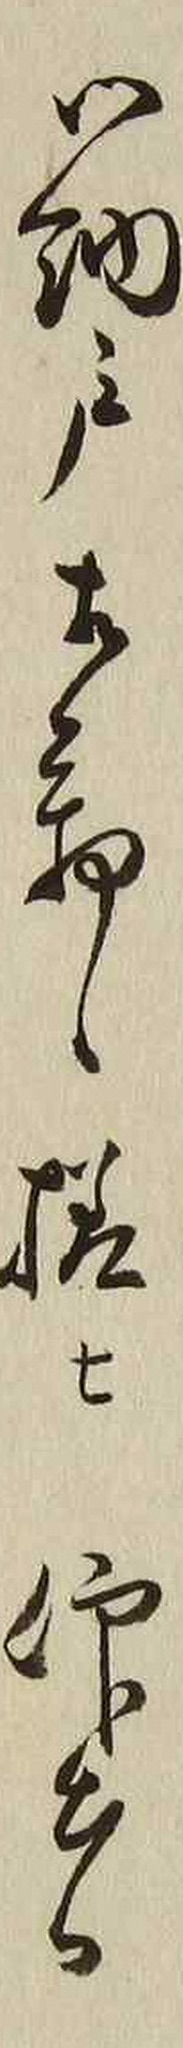御納戸相勤候様被仰出候
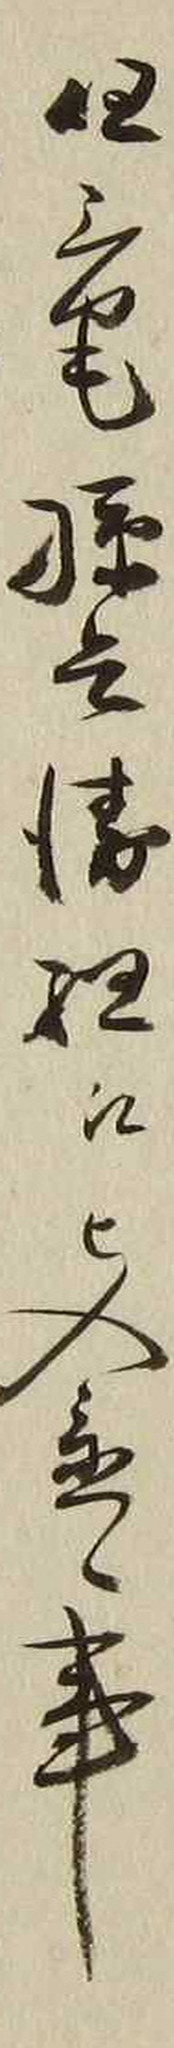但三宅孫兵衛組江被入置候事
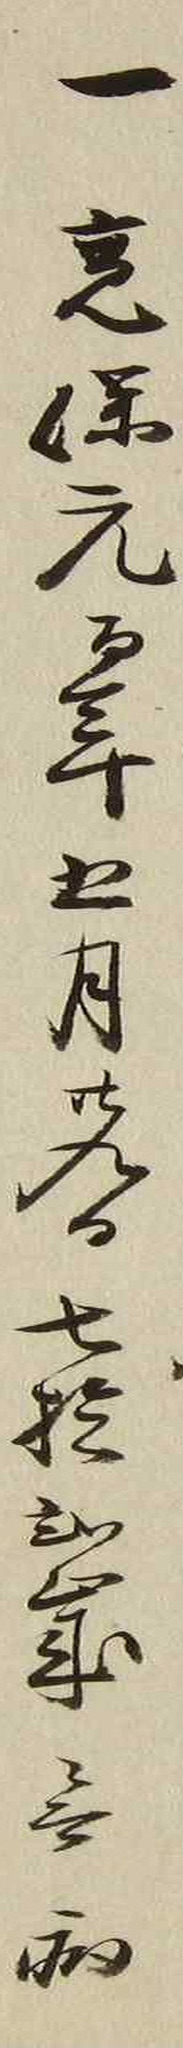一寛保元酉年五月廿九日七拾弐歳ニ而病
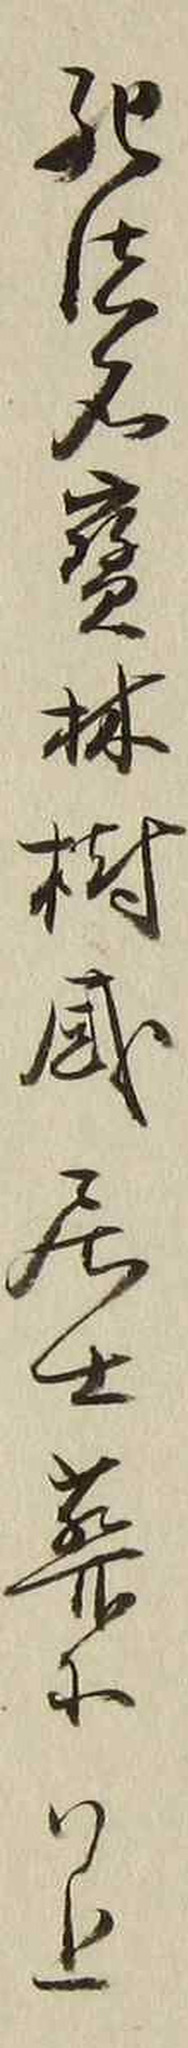死法名宝林樹感居士葬所同上
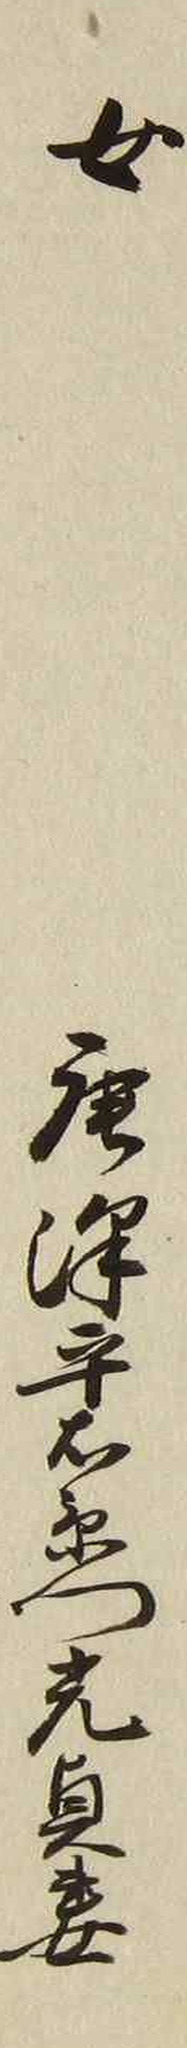女唐沢平右衛門光貞妻
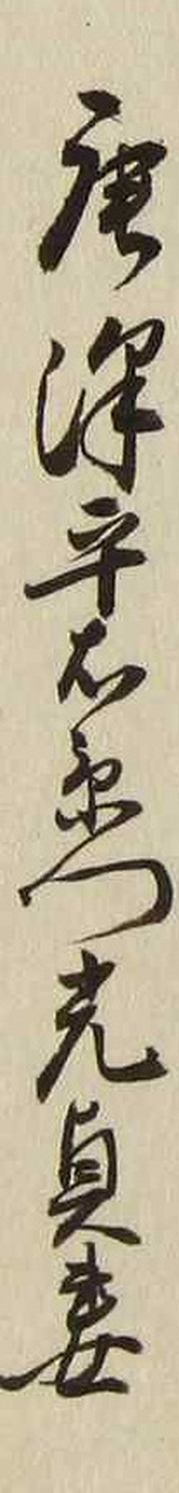女唐沢平右衛門光貞妻

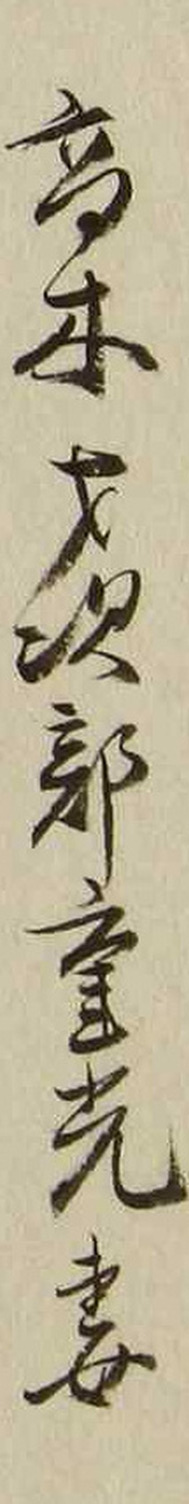高木才次郎重光妻
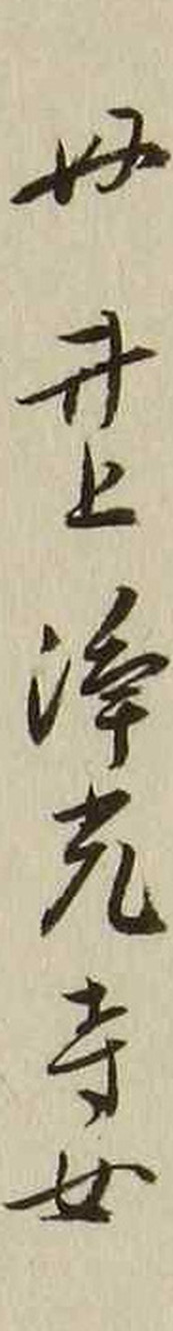母井上浄光寺女
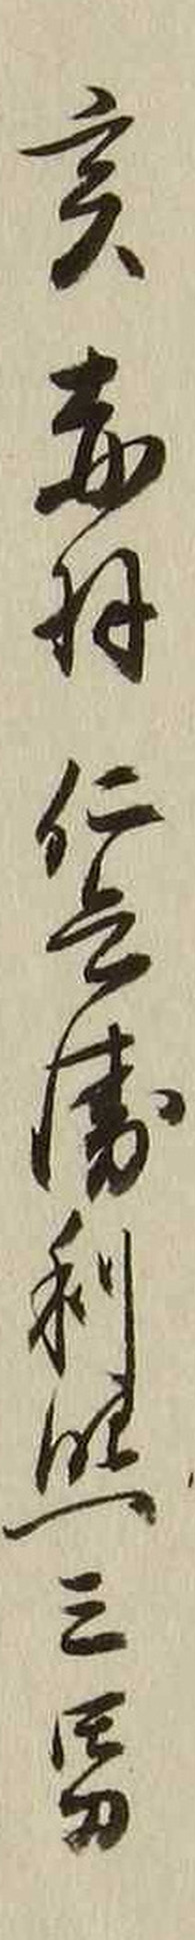実赤羽仁兵衛利照三男
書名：諸士系譜　巻之288　さ之部20
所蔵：会津若松市立会津図書館
